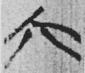六
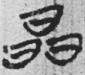晶
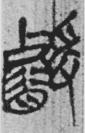○（渙）
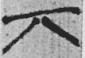亓（其）
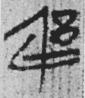躳
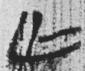亡
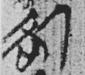咎
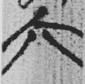六
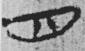四
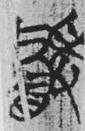○（渙）
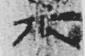亓（其）
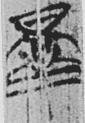羣
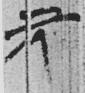元
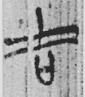吉
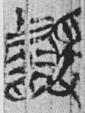○（渙）
